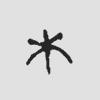木
